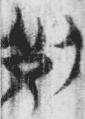死
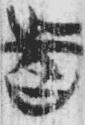者
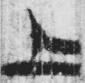上
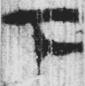下
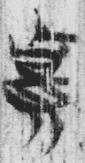貴
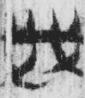戔（賤）
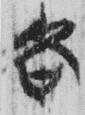各
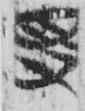○（得）
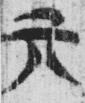亓（其）
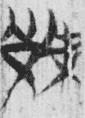○（世）
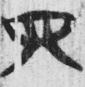四
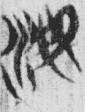○（海）
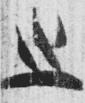之
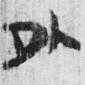外
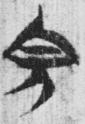○（賓）
